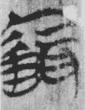{尒䎽}（問）
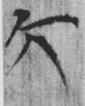大（太）
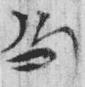公
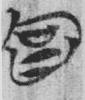○（望）
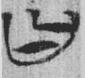○（答）
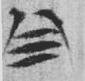丹
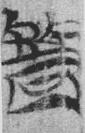箸（書）
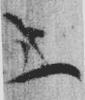之
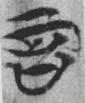言
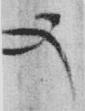又（有）
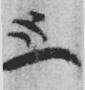之
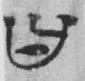曰
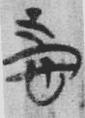志
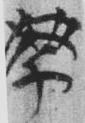○（勝）
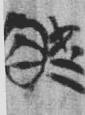欲
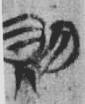則
